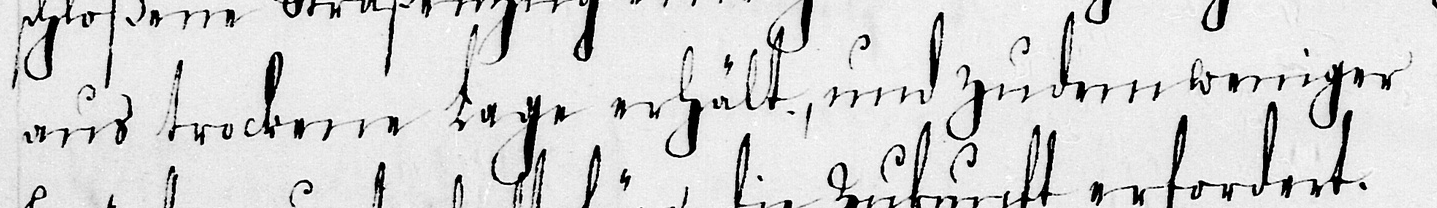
aus trockene Lage erhält, und zudem weniger
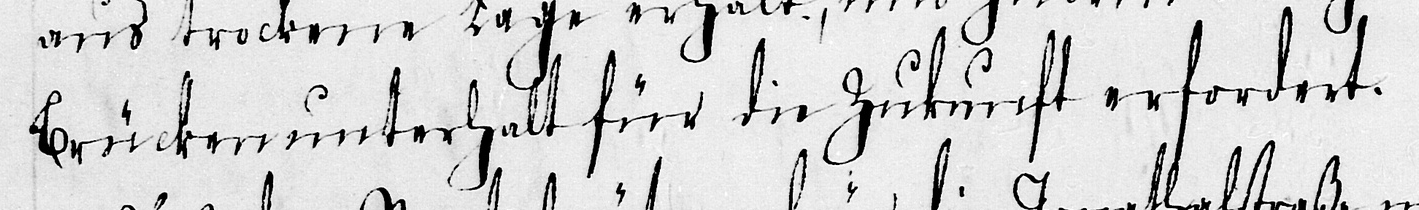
Brückenunterhalt für die Zukunft erfordert.
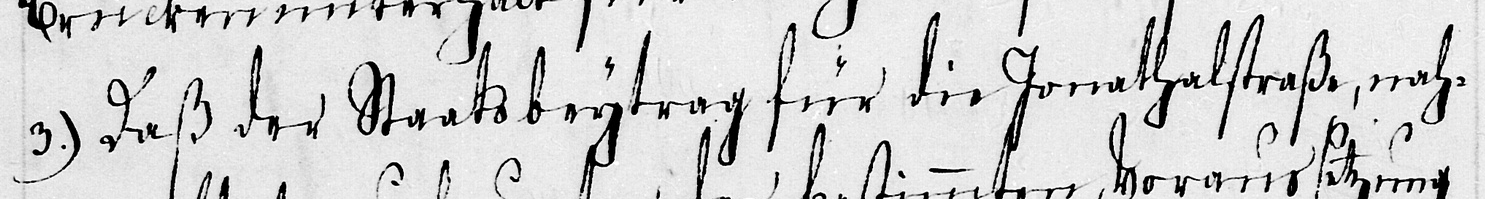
3.) Daß der Staatsbeytrag für die Jonathalstraße, nah¬
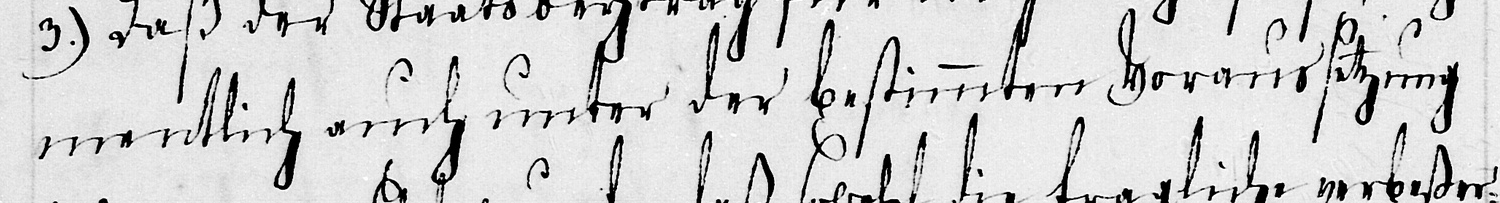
mentlich auch unter der bestimmten Voraussetzung
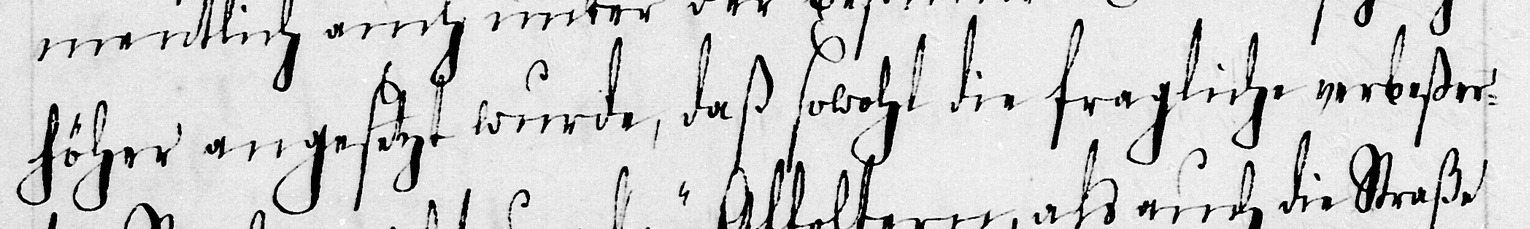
höher angesetzt wurde, daß sowohl die fragliche verbeßer¬
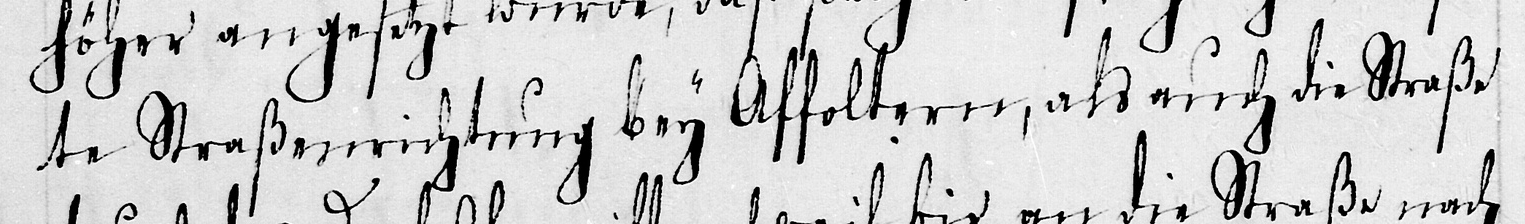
te Straßenrichtung bey Affoltern, als auch die Straße
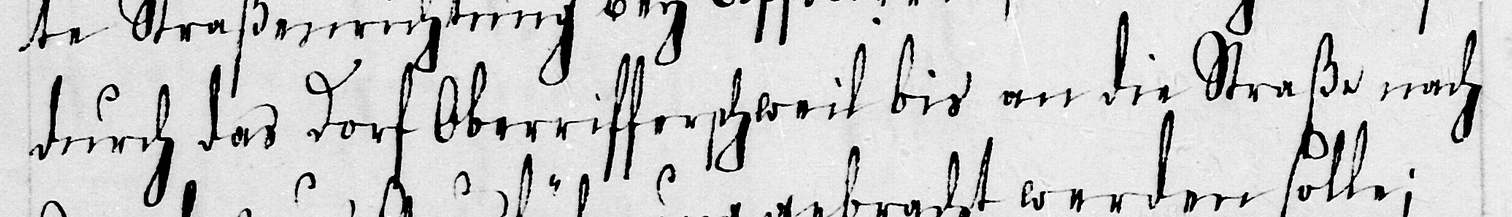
durch das Dorf Oberrifferschweil bis an die Straße nach
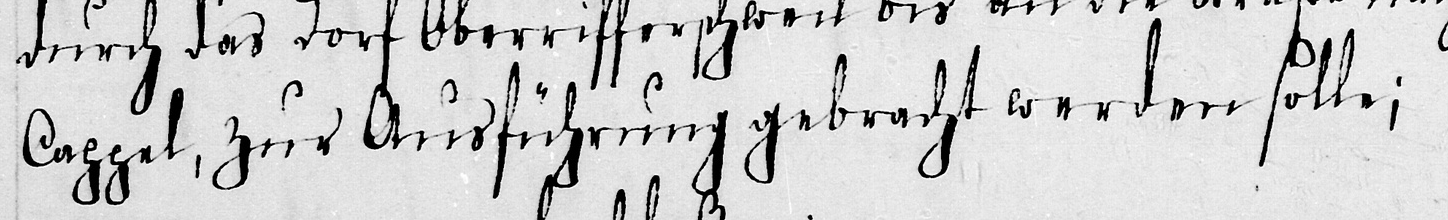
Cappel, zur Ausführung gebracht werden solle;
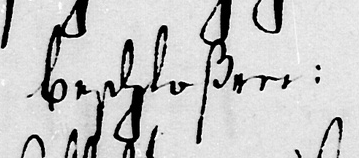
beschloßen:
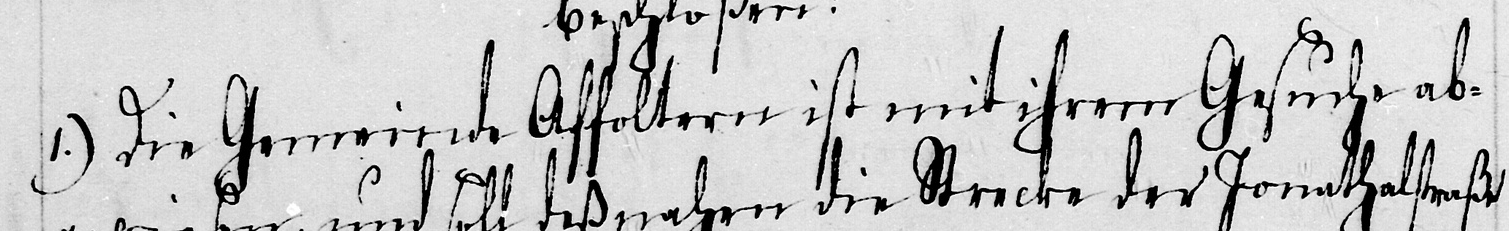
1.) Die Gemeinde Affoltern ist mit ihrem Gesuche ab¬
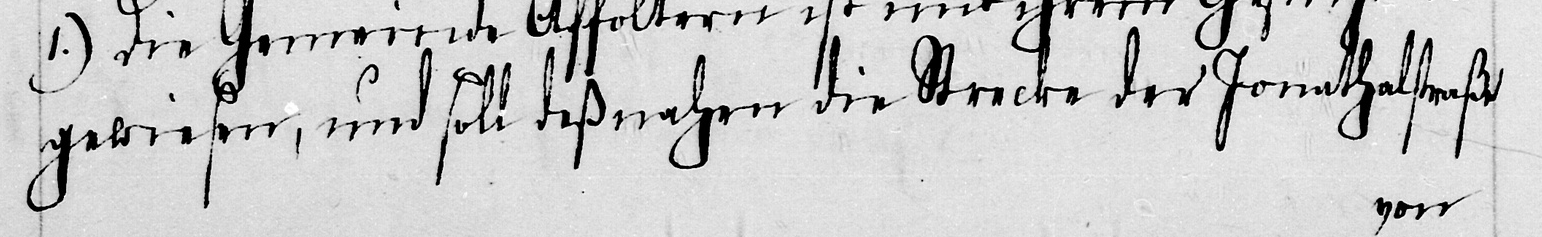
gewiesen, und soll deßnahen die Strecke der Jonathalstraße
